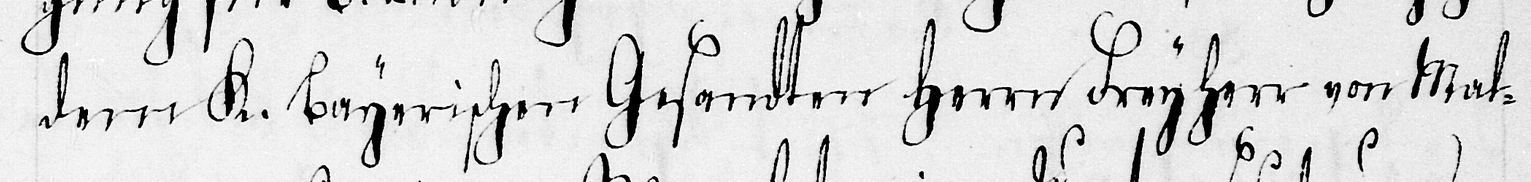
dem K. Bayerischen Gesandten Herrn Freyherr von Mat¬
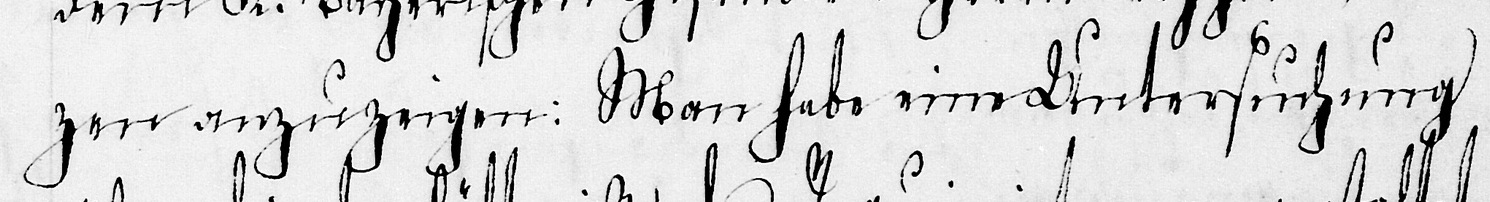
zen anzuzeigen: Man habe eine Untersuchung
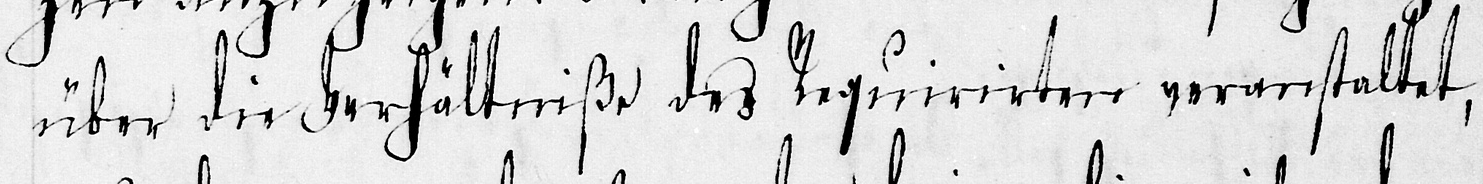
über die Verhältniße des Requirirten veranstaltet,
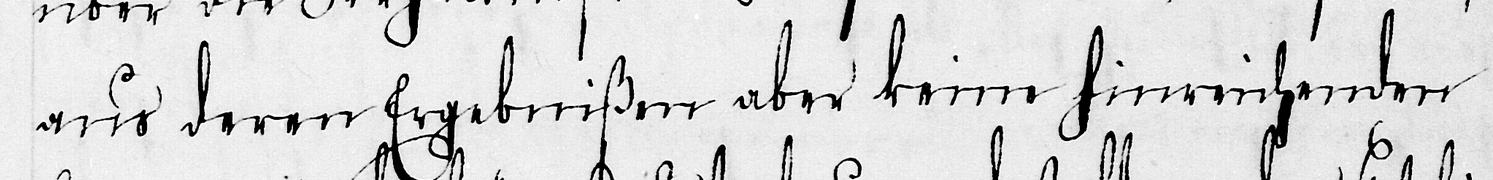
aus deren Ergebnißen aber keine hinreichenden
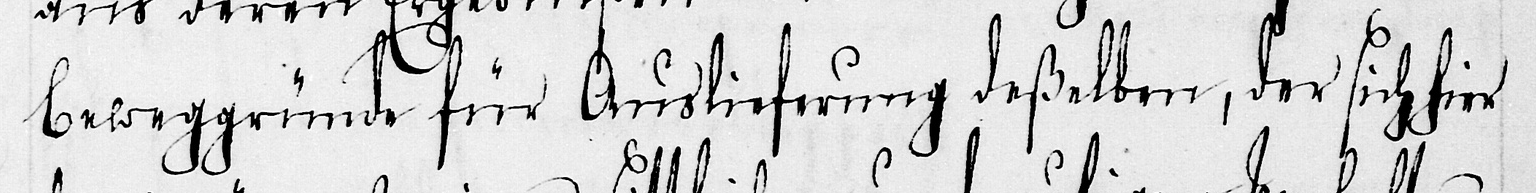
Beweggründe für Auslieferung deßelben, der sich hier
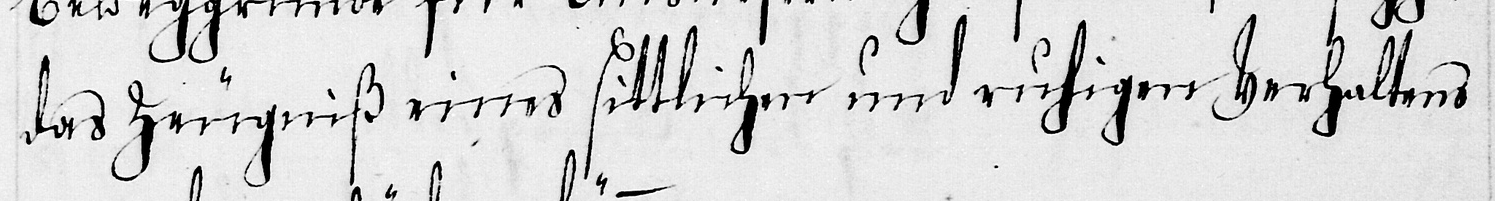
das Zeugniß eines sittlichen und ruhigen Verhaltens
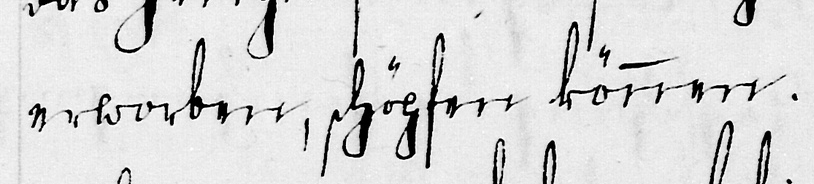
erworben, schöpfen können.
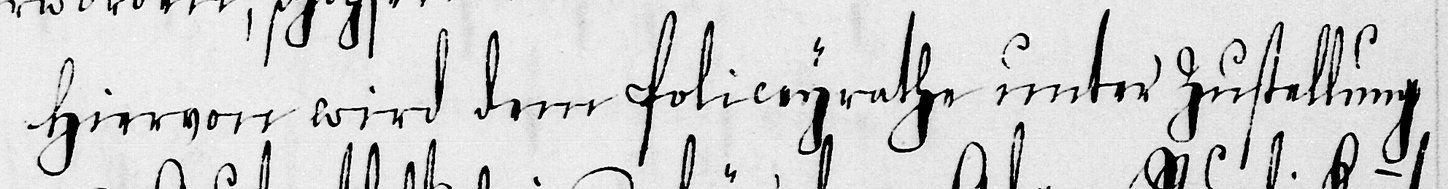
Hiervon wird dem Policeyrathe unter Zustellung
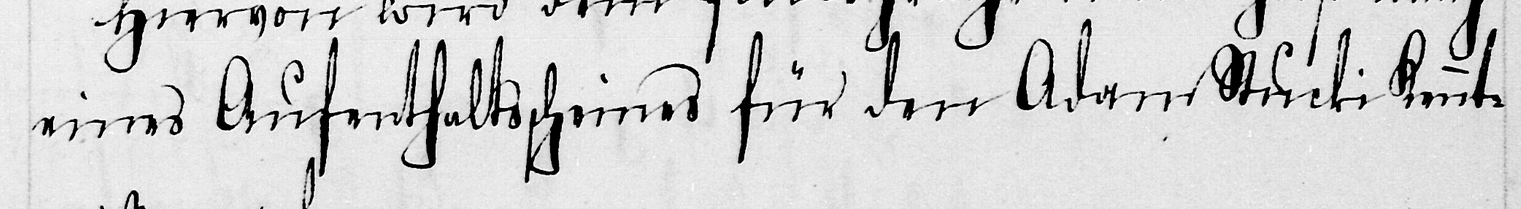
eines Aufenthaltsscheines für den Adam Stucki Kenn¬
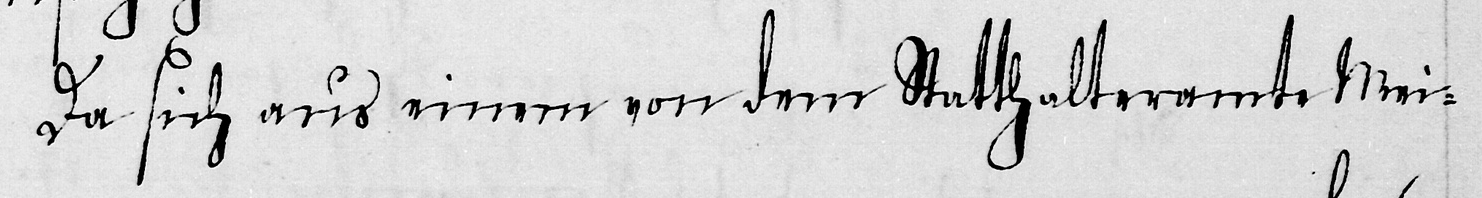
Da sich aus einem von dem Statthalteramte Mei-
